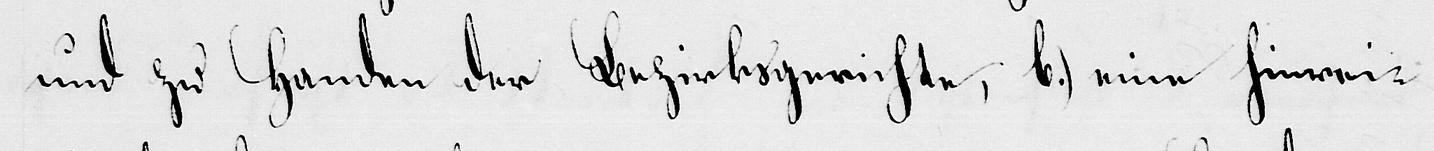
und zu Handen der Bezirksgerichte, b.) eine hinrei¬
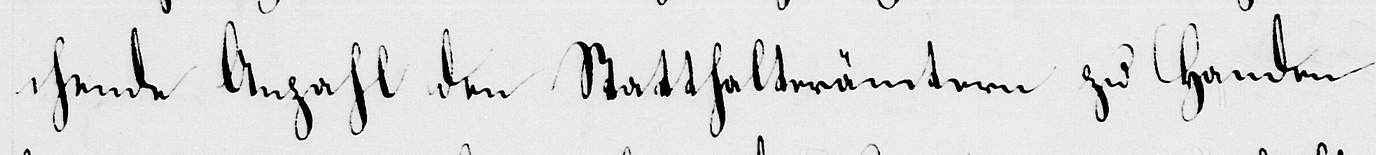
chende Anzahl den Statthalterämtern zu Handen
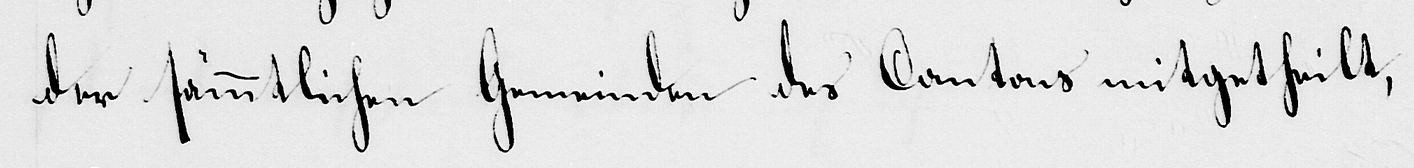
der sämmtlichen Gemeinden des Cantons mitgetheilt,
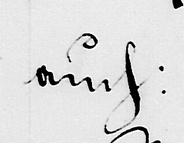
auch:
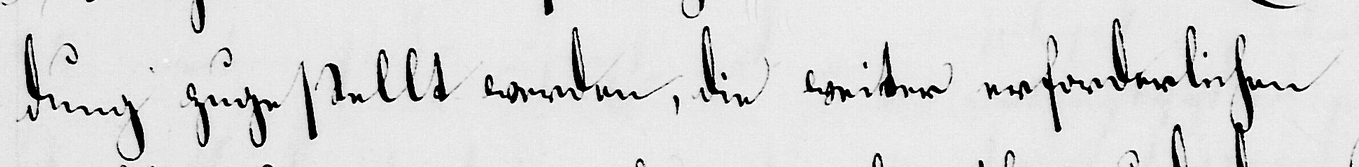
dung zugestellt werden, die weiter erforderlichen
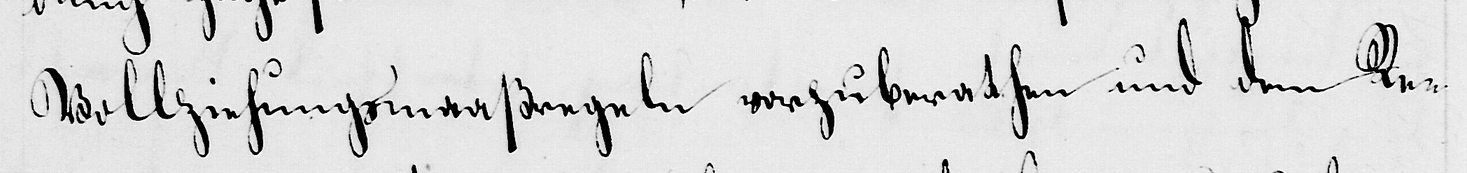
Vollziehungsmaaßregeln vorzuberathen und dem Re¬
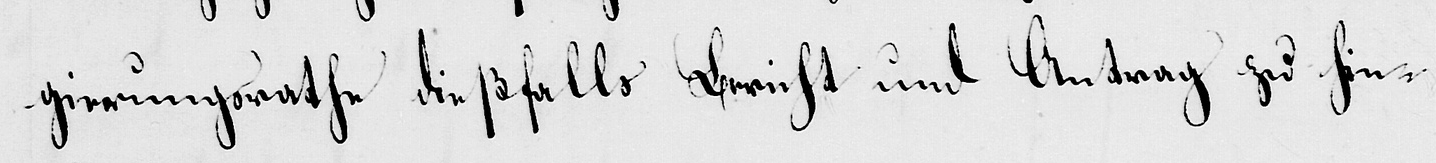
gierungsrathe dießfalls Bericht und Antrag zu hin¬
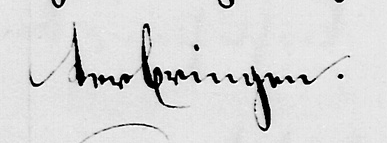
terbringen.
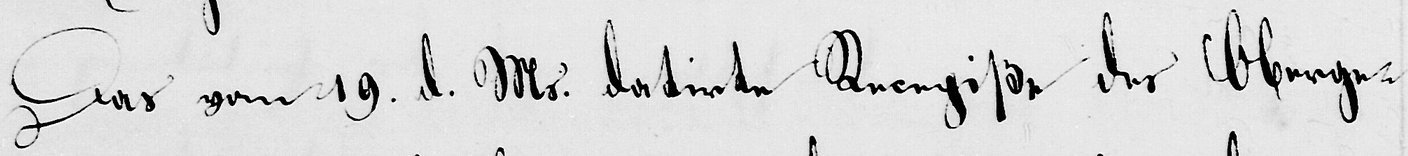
Das vom 19. d. Ms. datirte Recepiße des Oberge¬
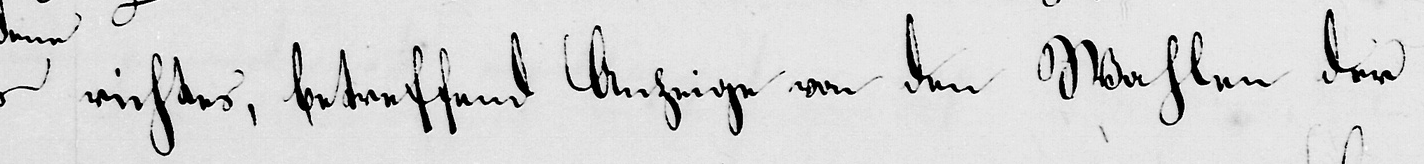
richtes, betreffend Anzeige von den Wahlen der
